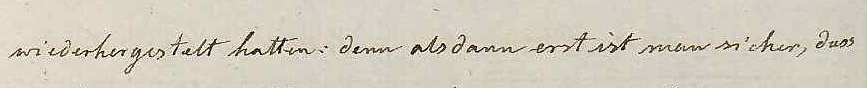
wiederhergestelt hatten: denn alsdann erst ist man sicher, dass
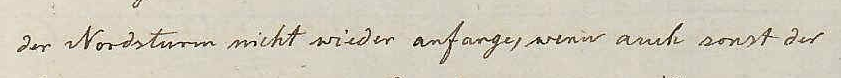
der Nordsturm nicht wieder anfange, wenn auch sonst der
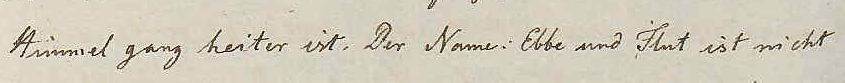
Himmel ganz heiter ist. Der Name: Ebbe und Flut ist nicht
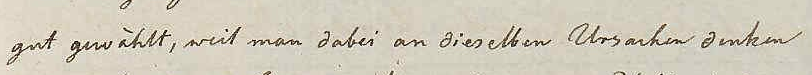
gut gewählt, weil man dabei an dieselben Ursachen denken
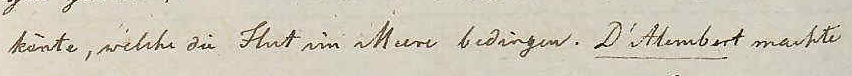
könte, welche die Flut im Meere bedingen. D'Alembert machte
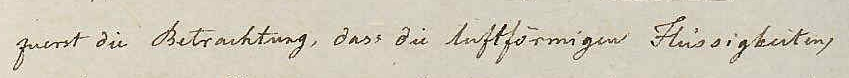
zuerst die Betrachtung, dass die luftförmigen Flüssigkeiten,
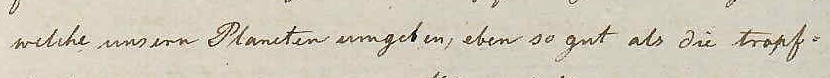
welche unsern Planeten umgeben, eben so gut als die tropf-
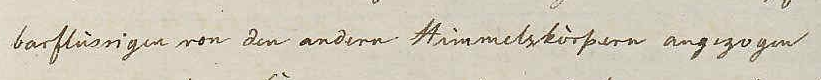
barflüssigen von den andern Himmelskörpern angezogen
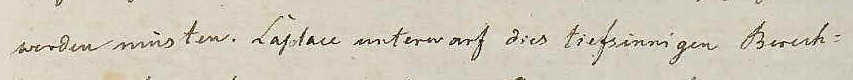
werden müsten. Laplace unterwarf dies tiefsinnigen Berech-
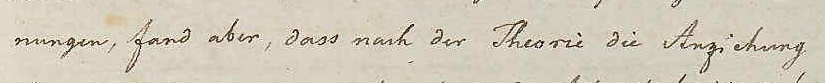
nungen, fand aber, dass nach der Theorie die Anziehung
